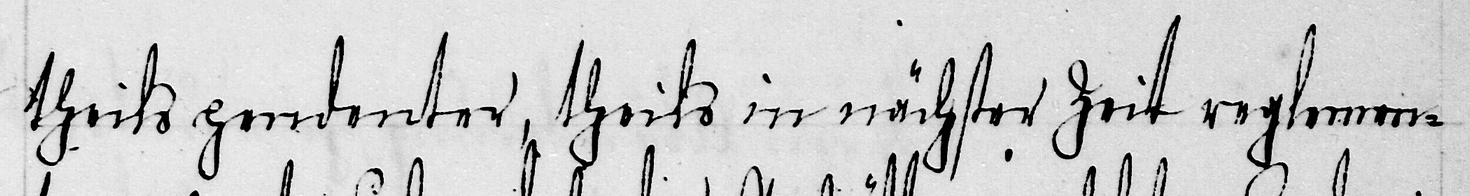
theils pendenter, theils in nächster Zeit reglemen¬
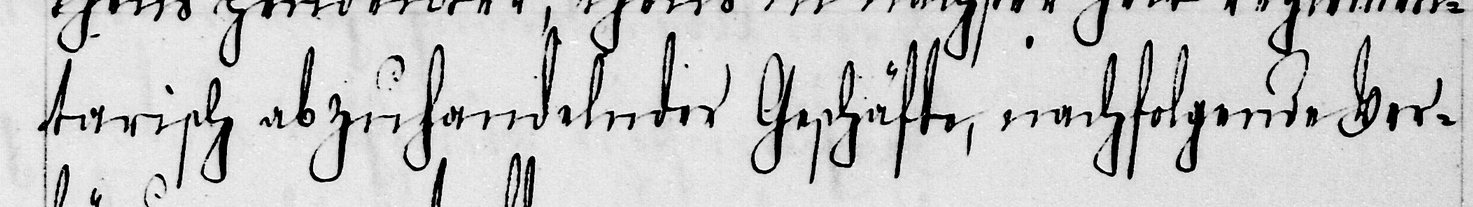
tarisch abzuhandelnder Geschäfte, nachfolgende Ver¬
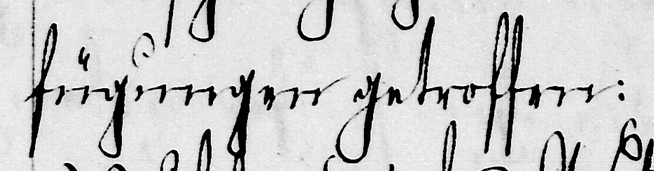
fügungen getroffen:
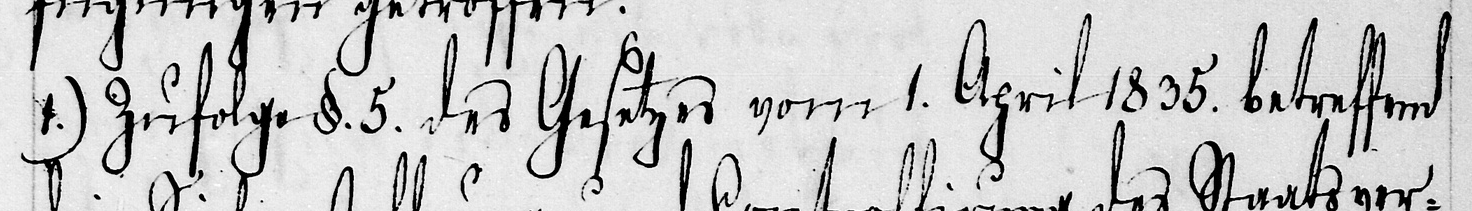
1.) Zufolge §. 5. des Gesetzes vom 1. April 1835. betreffend
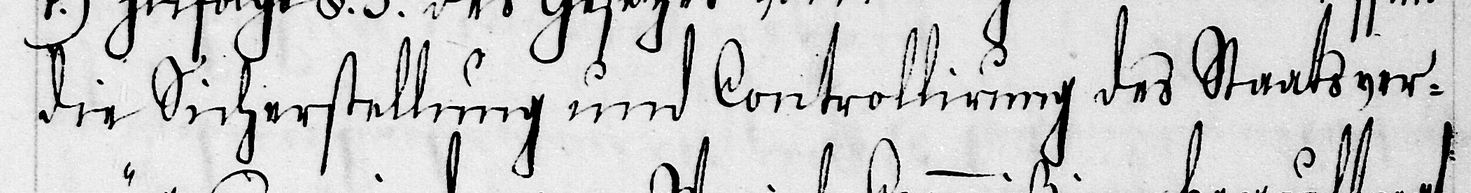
die Sicherstellung und Controllirung des Staatsver¬
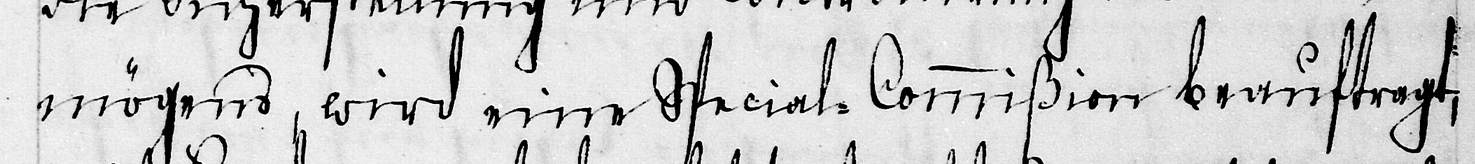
mögens, wird eine Special-Commißion beauftragt,
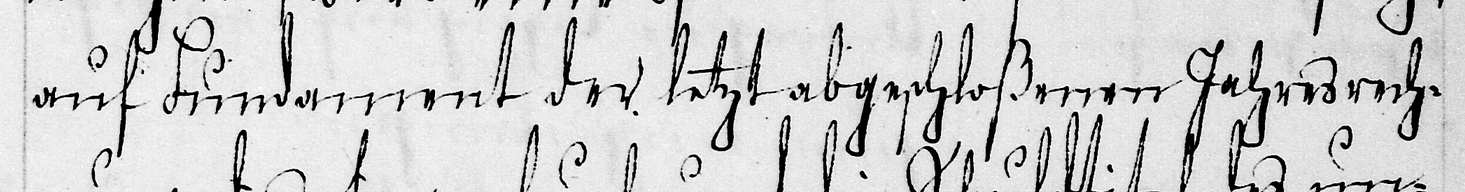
auf Fundament der letzt abgeschloßenen Jahresrech¬
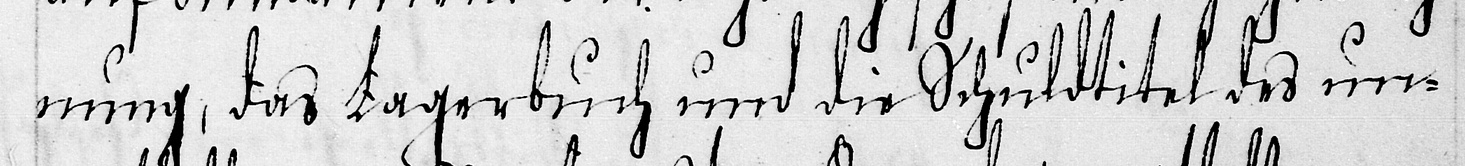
nung, das Lagerbuch und die Schuldtitel des un¬
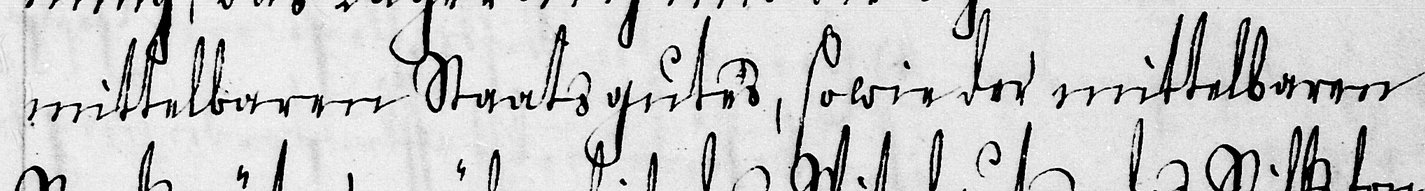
mittelbaren Staatsgutes, sowie der unmittelbaren
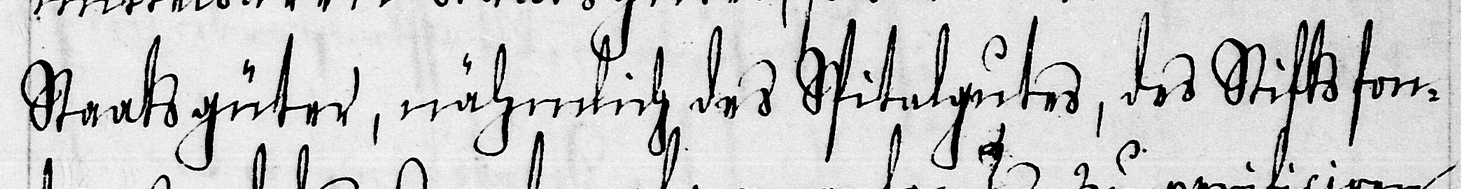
Staatsgüter, nämlich des Spitalgutes, des Stiftsfon¬
